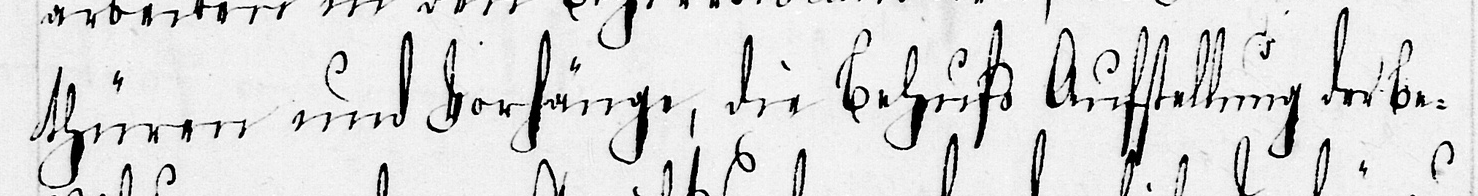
thüren und Vorhänge, die Behufs Aufstellung der
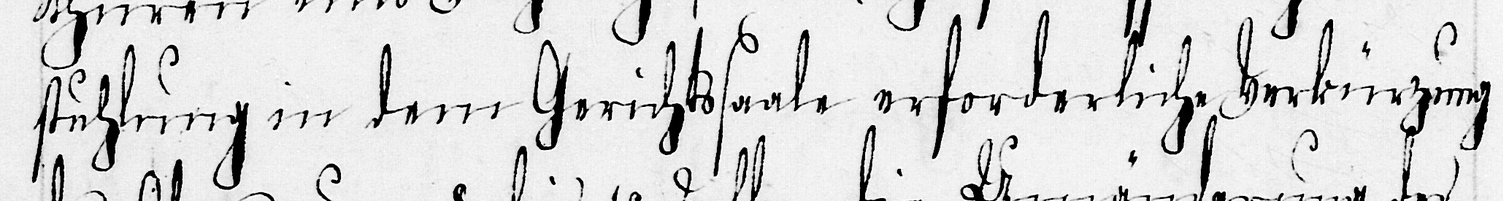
stuhlung in dem Gerichtssaale erforderliche Verkürzung
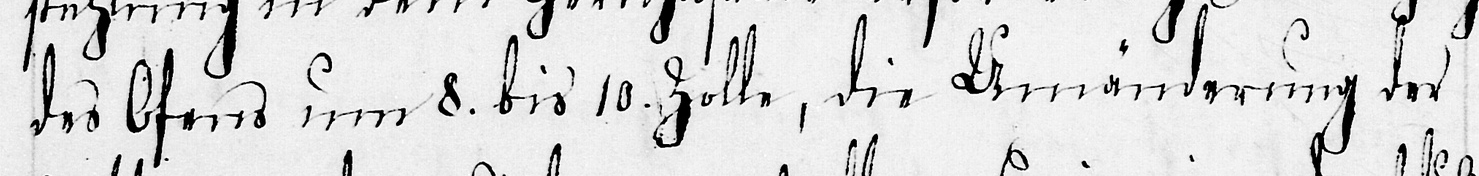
des Ofens um 8. bis 10. Zolle, die Umänderung der
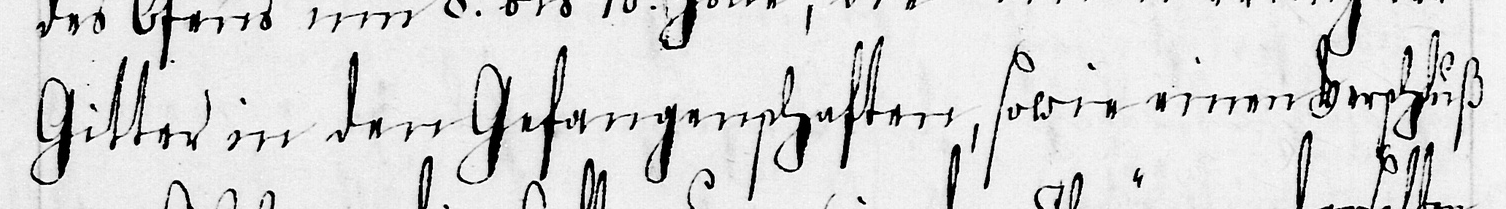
Gitter in den Gefangenschaften, sowie einen Verschluß
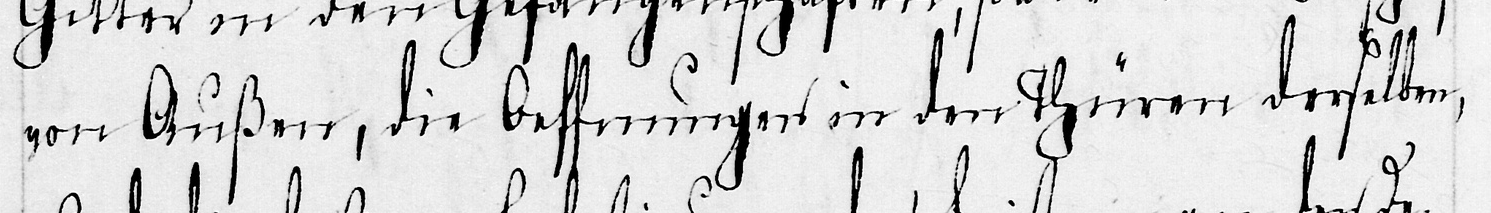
von Außen, die Oeffnungen in den Thüren derselben,
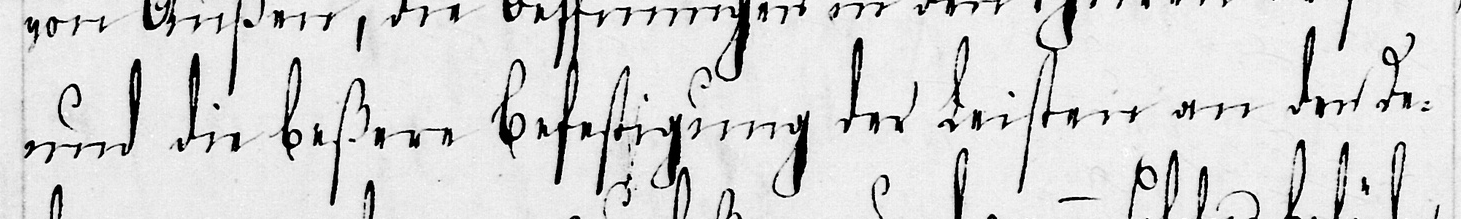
und die beßere Befestigung der Leisten an den De¬
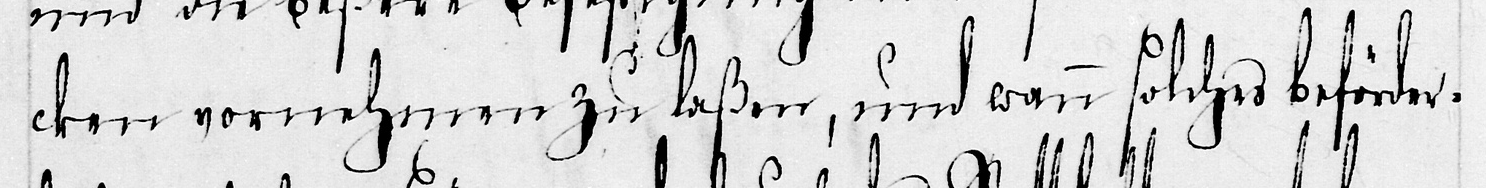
cken vornehmen zu laßen, und wann solches beförder¬
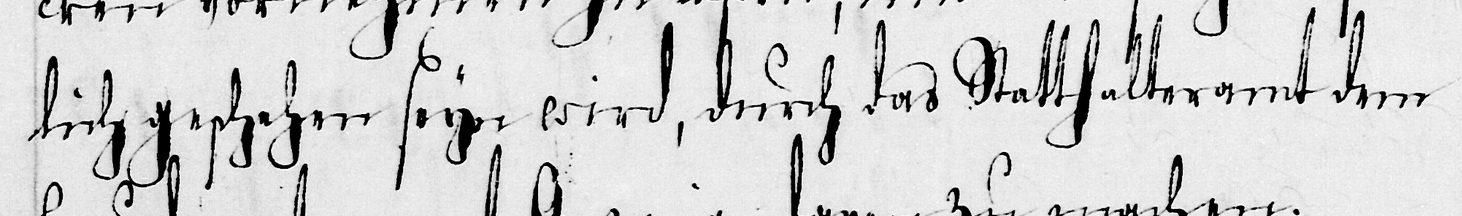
lich geschehen seyn wird, durch das Statthalteramt dem
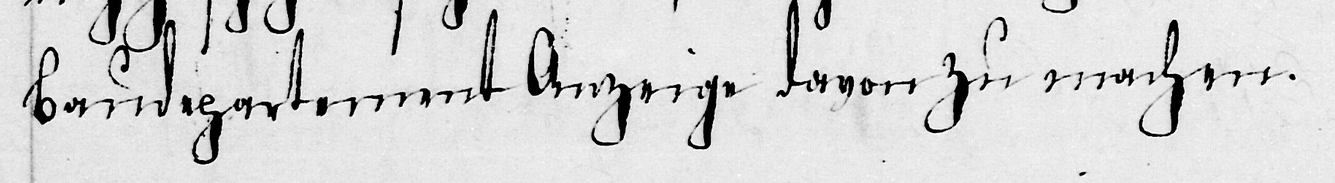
Baudepartement Anzeige davon zu machen.
